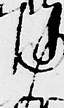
6.
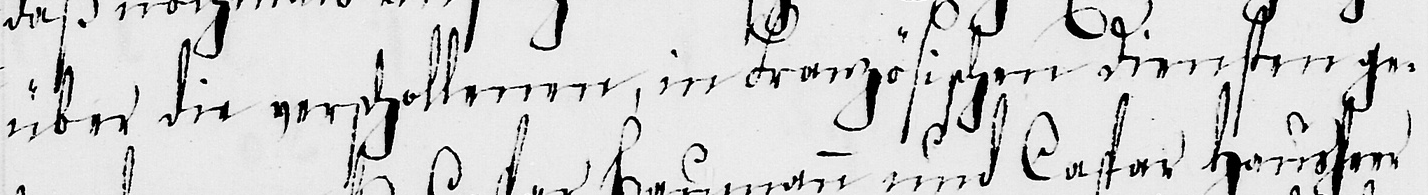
über die verschollenen, in Französischen Diensten ge¬
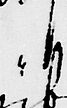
2.
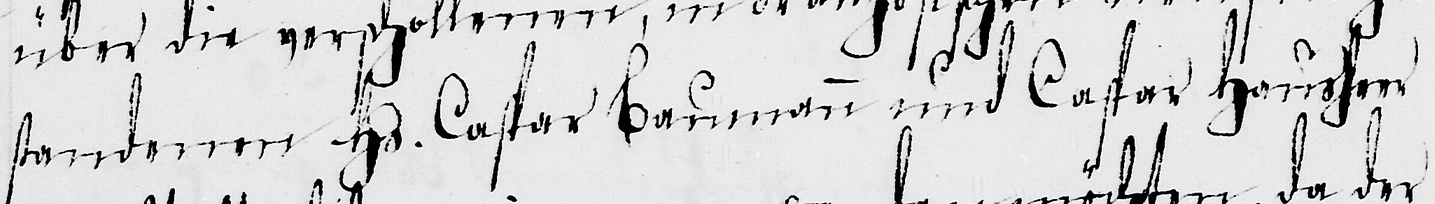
standenen Hs. Caspar Baumann und Caspar Hausheer
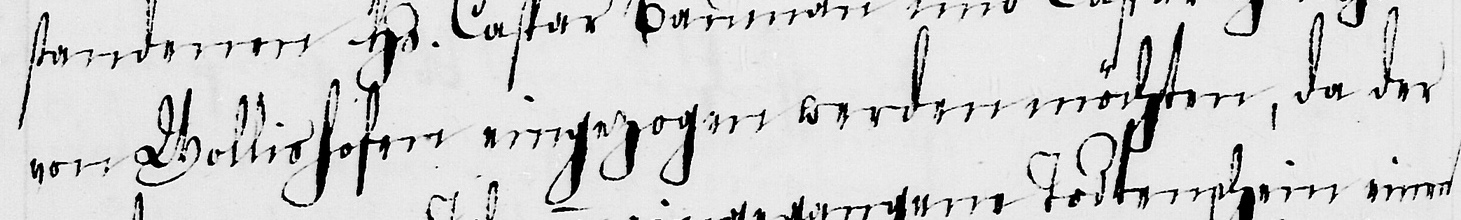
von Wollishofen eingezogen werden möchten, da der
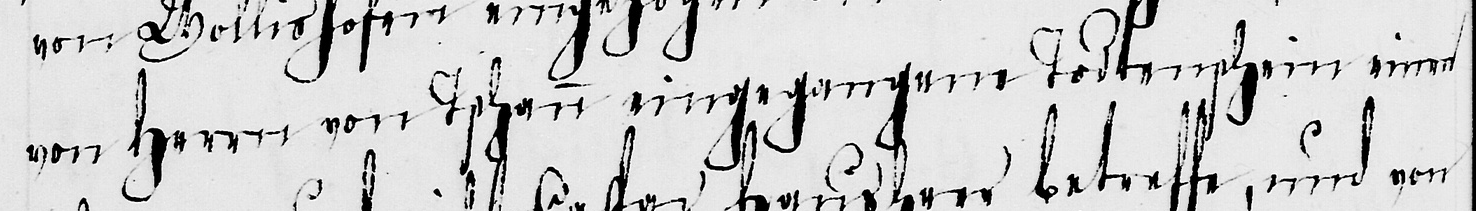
von Herrn von Tschann eingegangene Todtenschein einen
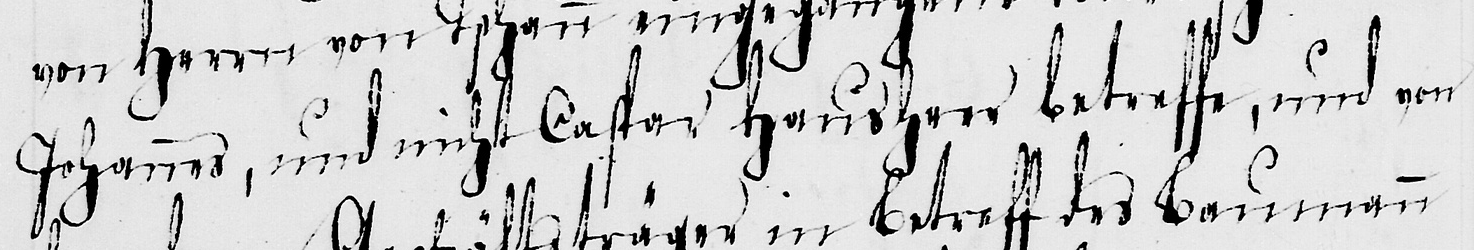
Johannes, und nicht Caspar Hausheer betreffe, und von
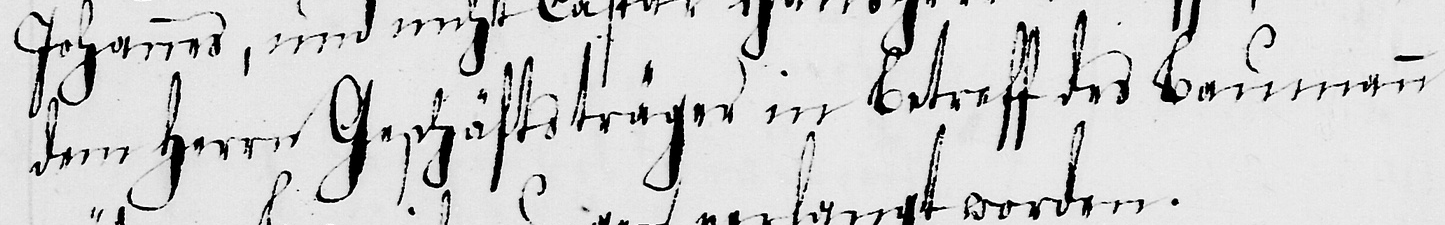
dem Herrn Geschäftsträger in Betreff des Baumann
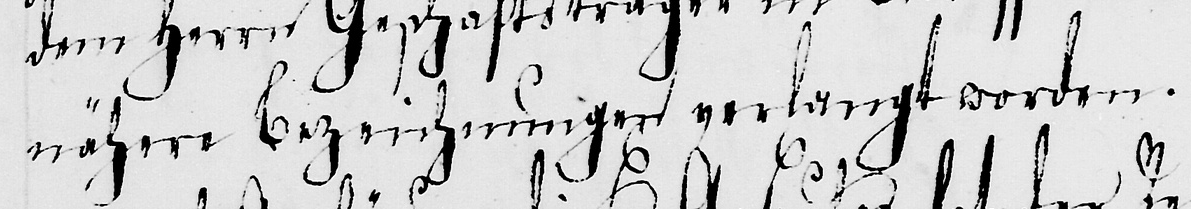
nähere Bezeichnungen verlangt worden.
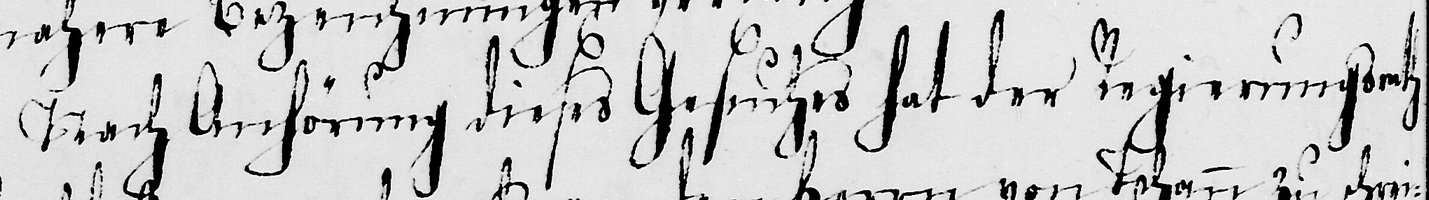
Nach Anhörung dieses Gesuches hat der Regierungsr¬
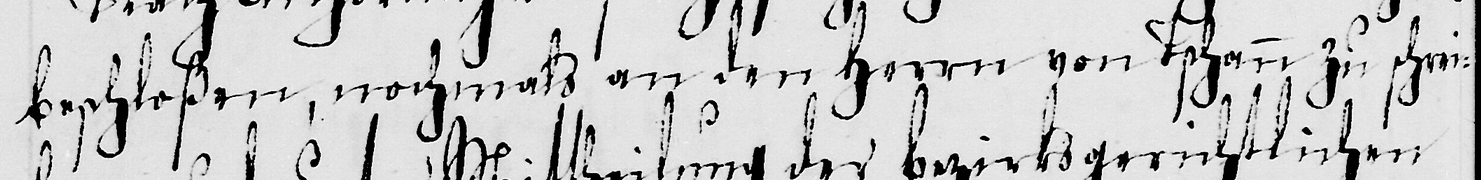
beschloßen, nochmals an den Herrn von Tschann zu schre¬
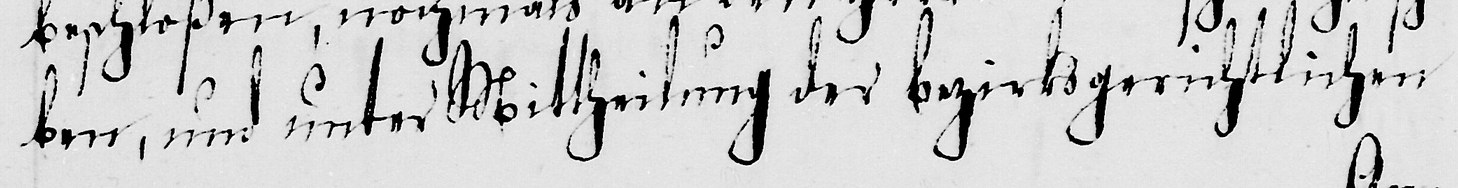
iben, und unter Mittheilung der bezirksgerichtlichen
